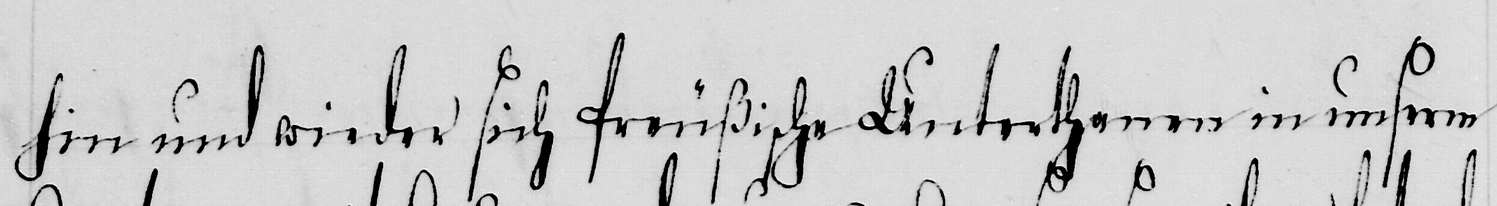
hin und wieder sich Preußische Unterthanen in unserm
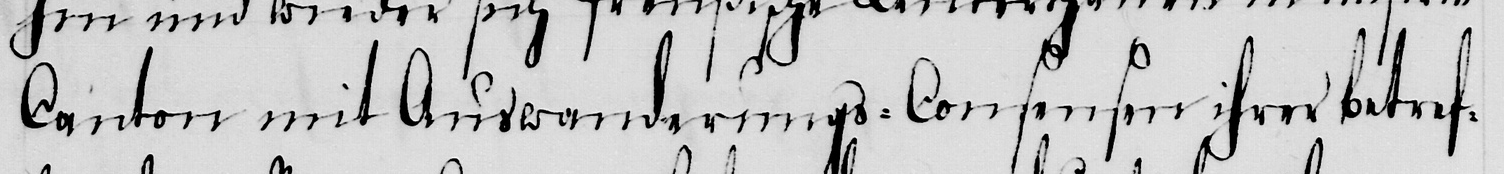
Canton mit Auswanderungs-Consensen ihrer betref¬
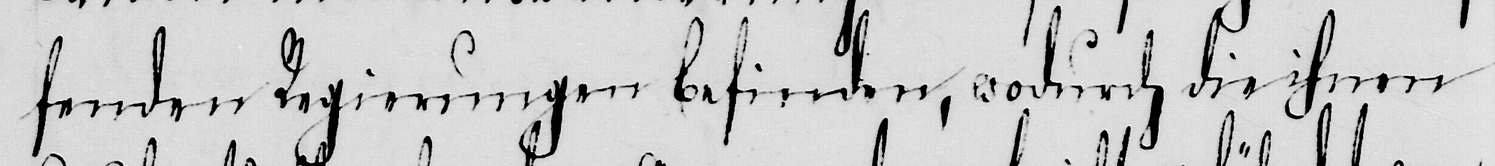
fenden Regierung befinden, wodurch die ihnen
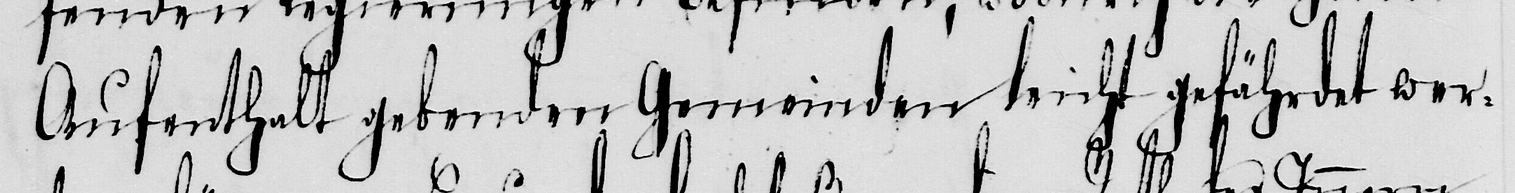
Aufenthalt gebenden Gemeinden leicht gefährdet wer¬
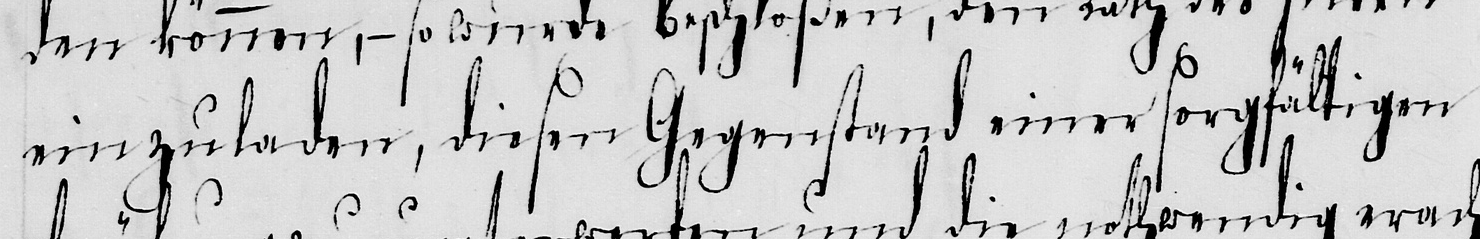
einzuladen, diesen Gegenstand einer sorgfältigen
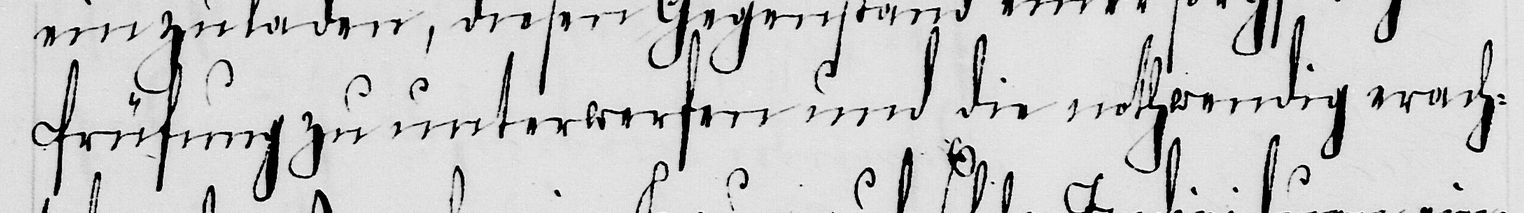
Prüfung zu unterwerfen und die nothwendig erach¬
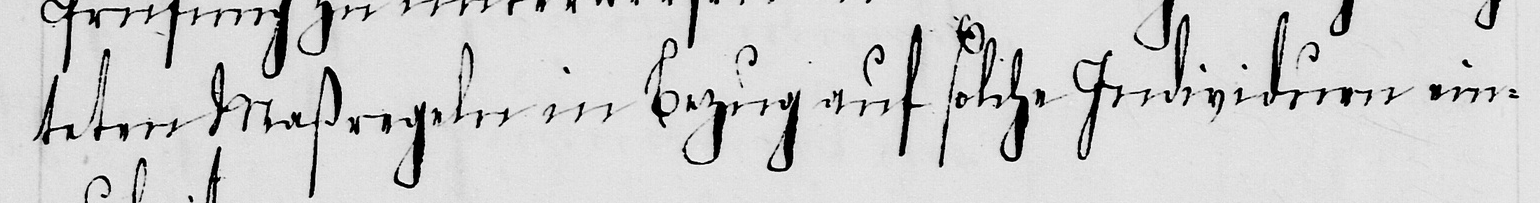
teten Maßregeln in Bezug auf solche Individuen ein¬
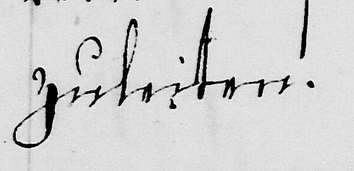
zuleiten.
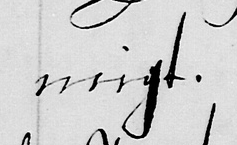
migt.
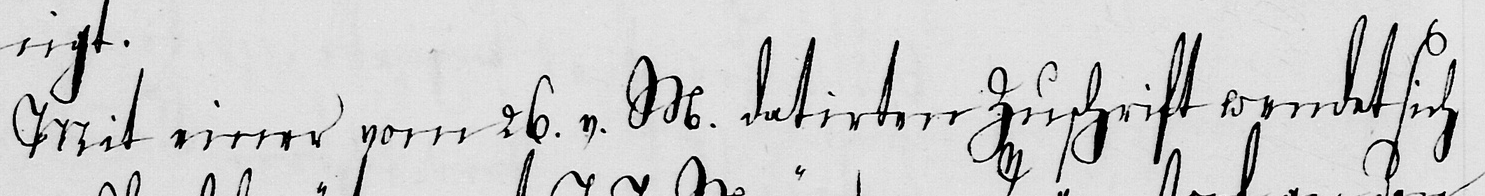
Mit einer vom 26. v. M. datirten Zuschrift wendet sich
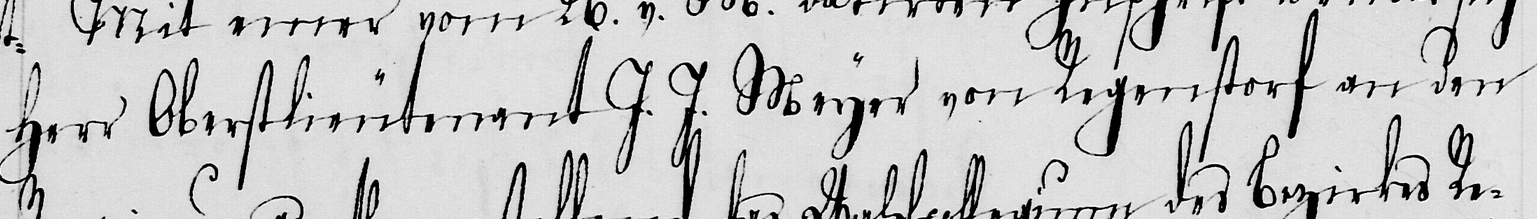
Herr Oberstlieutenant J. J. Meyer von Regenstorf an den
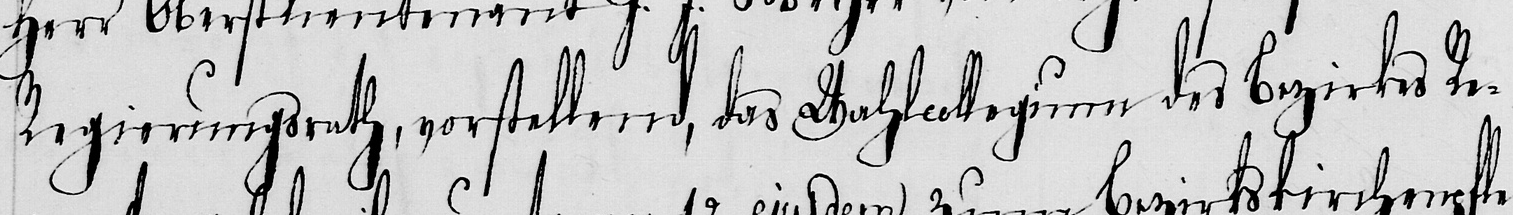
Regierungsrath, vorstellend, das Wahlcollegium des Bezirkes Re¬
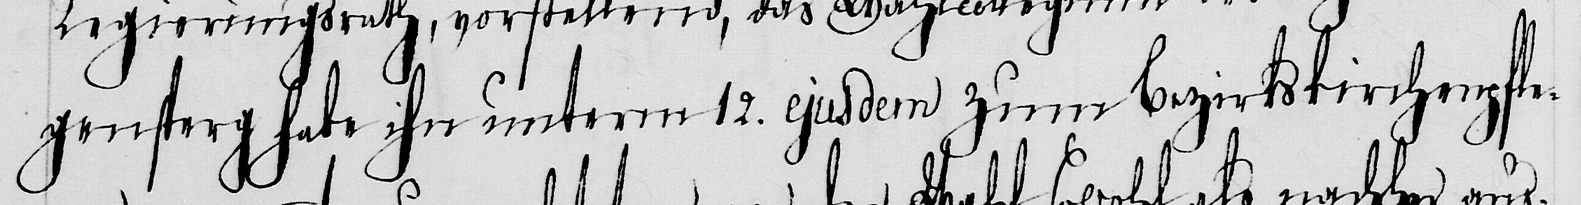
gensberg habe ihn unterm 12. ejusdem zum Bezirkskirchenpfle¬
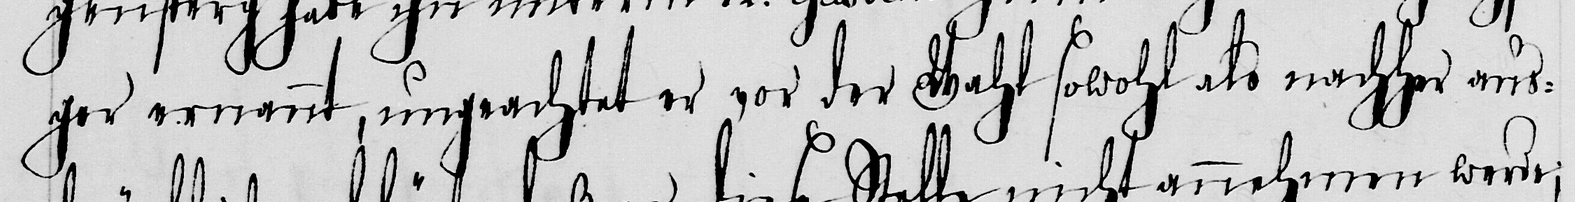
ger ernannt, ungeachtet er vor der Wahl sowohl als nachher aus¬
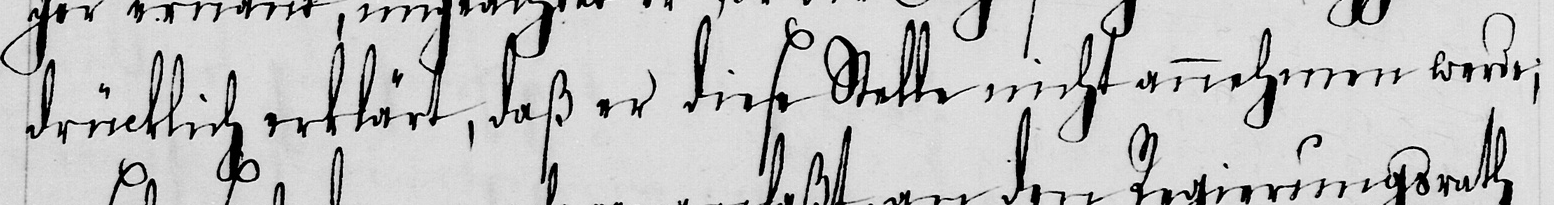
drücklich erklärt, daß er diese Stelle nicht annehmen werde;
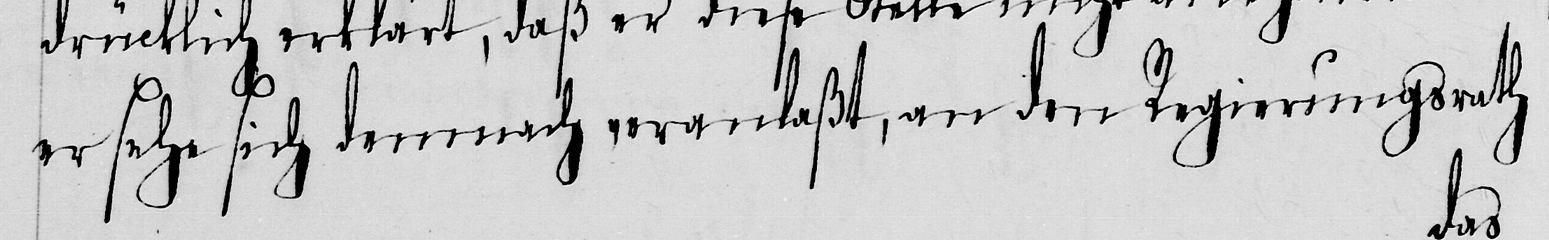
er sehe sich demnach veranlaßt, an den Regierungsrath
